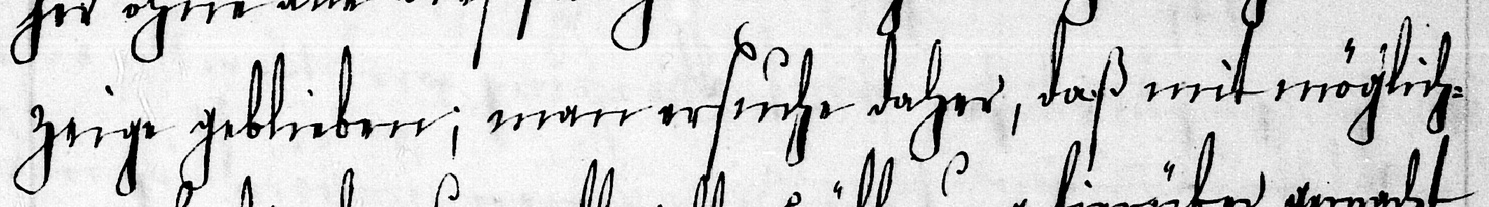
zeige geblieben; man ersuche daher, daß mit möglich¬
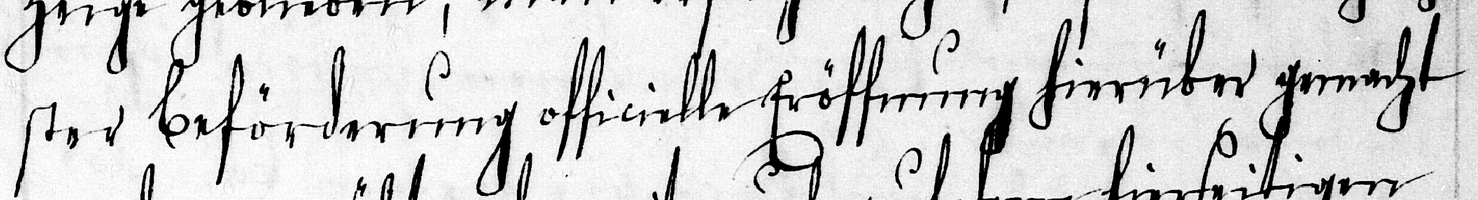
ster Beförderung officielle Eröffnung hierüber gemacht
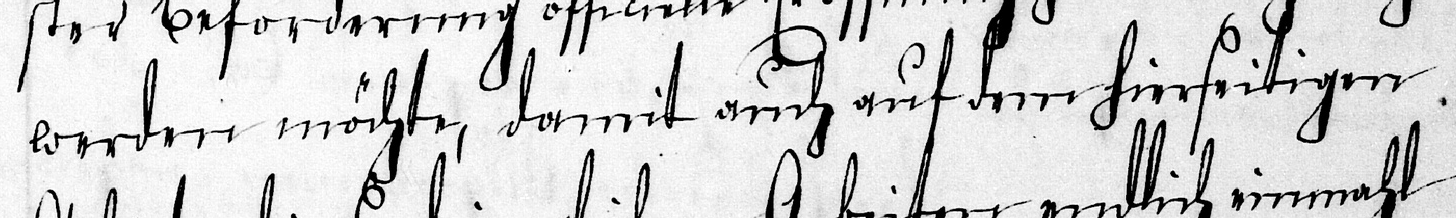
werden möchte, damit auch auf dem hierseitigen
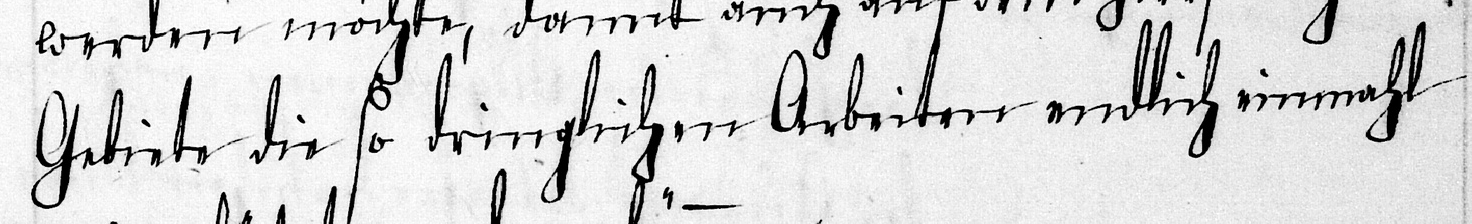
Gebiete die so dringlichen Arbeiten endlich einmahl
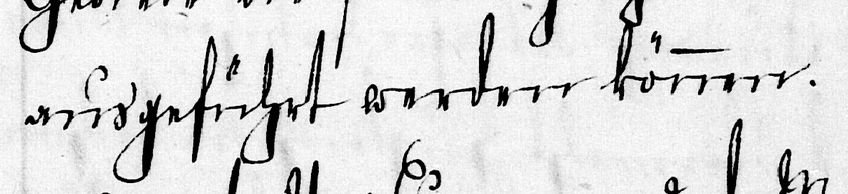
ausgeführt werden können.
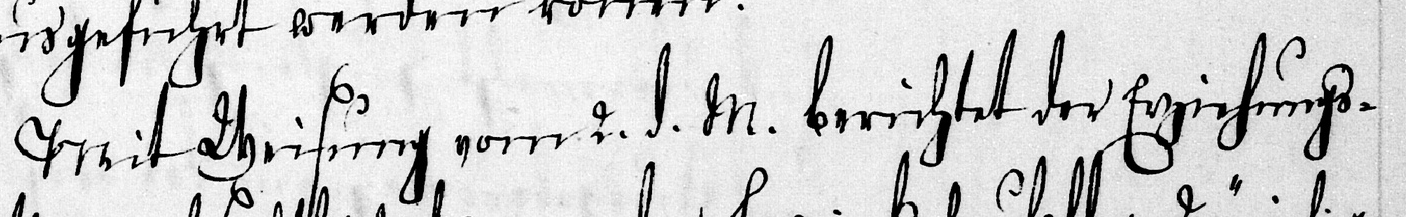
Mit Weisung vom 2. d. M. berichtet der Erziehungsr¬
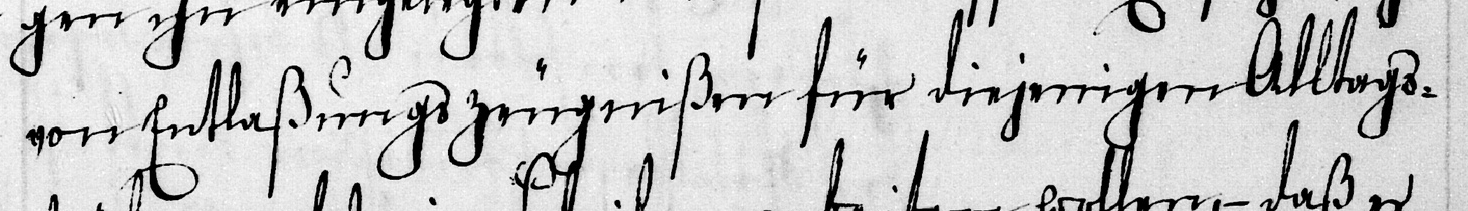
von Entlaßungszeugnißen für diejenigen Alltags¬
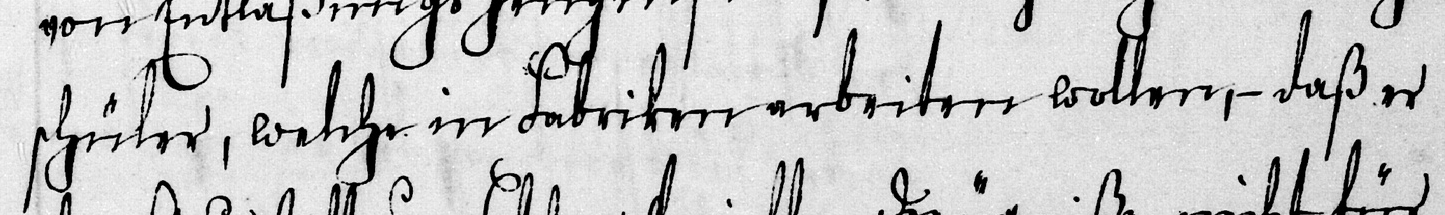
schüler, welche in Fabriken arbeiten wollen, – daß er
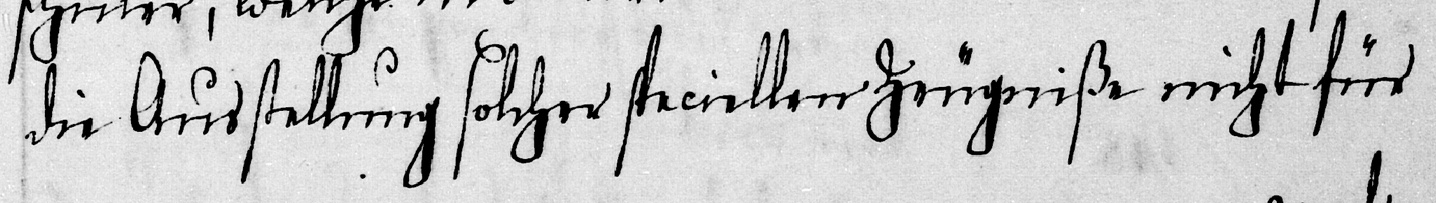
die Ausstellung solcher speciellen Zeugniße nicht für
